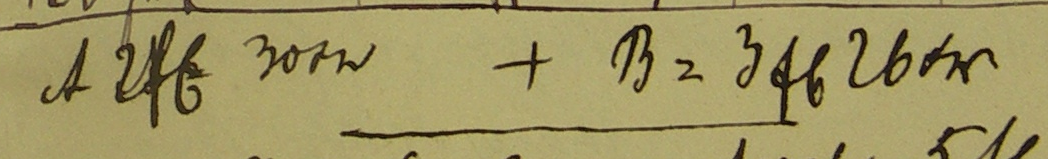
A = 2 Fl. 30 tw. + B = 3 Fl. 26 tw
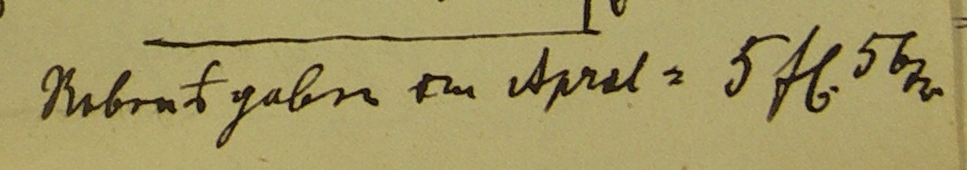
Nebenausgaben im April 5 Fl. 26 tw.
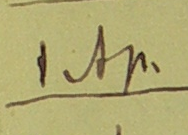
1. April
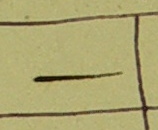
-
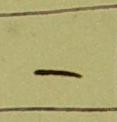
-
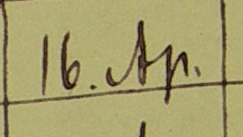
16. April
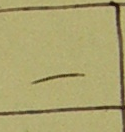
-
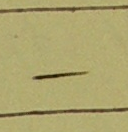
-
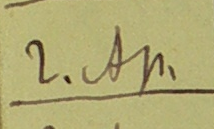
2. April
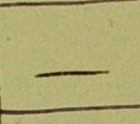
-
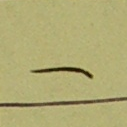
-
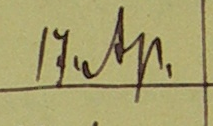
17. April
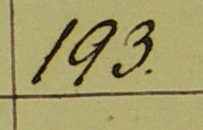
193
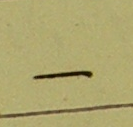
-
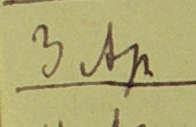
3. April
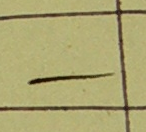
-
